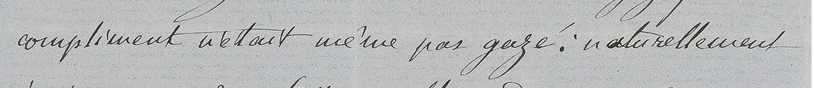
compliment n'était même pas gazé: naturellement
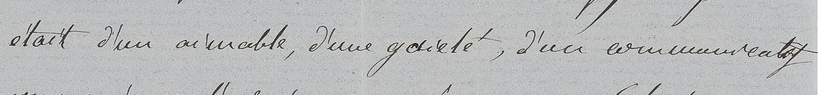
était d'un aimable, d'une gaieté, d'un communicatif
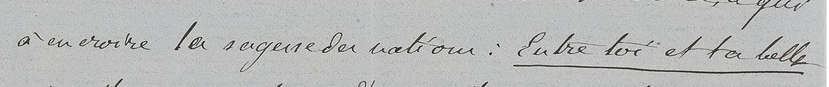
à en croire la sagesse des nations: Entre toi et ta belle
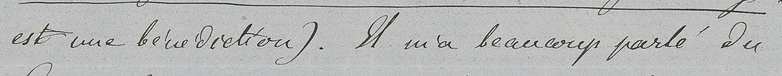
est une bénediction). Il m'a beaucoup parlé du
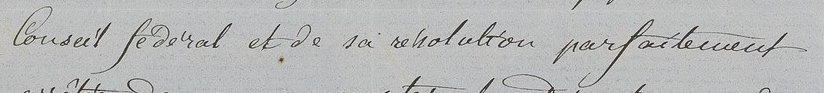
Conseil fédéral et de sa revolution parfaitement
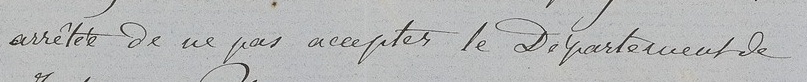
arrêtée de ne pas accepter le Departement de
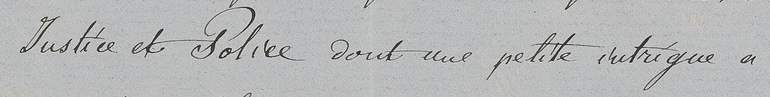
Justice et Police dont une petite intrigue a
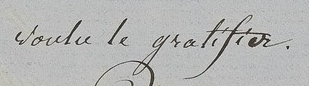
voulu le gratifier.
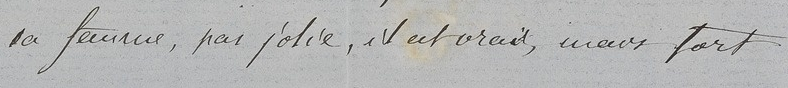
sa femme, pas jolie, il est vrais, mais fort
